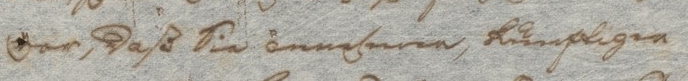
vor, daß Sie annehmen, künftigen
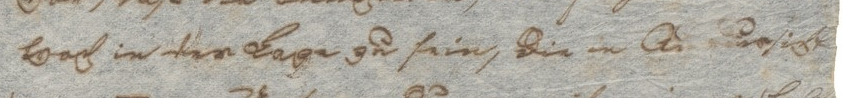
woch in der Lage zu sein, die in Aussicht
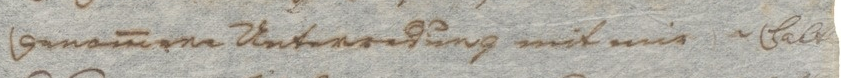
genommene Unterredung mit mir halten
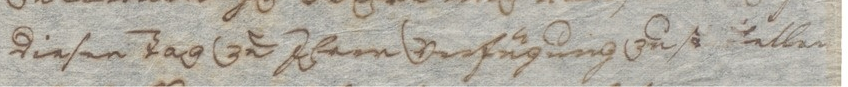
diesen Tag zu Ihrer Verfügung zu stellen
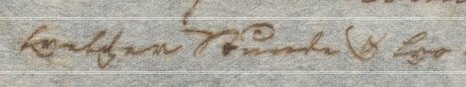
welcher Stunde & wo.
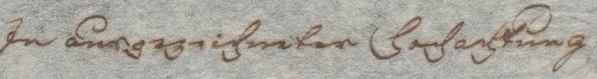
In ausgezeichneter Hochachtung
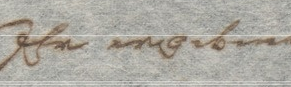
Ihr ergebener
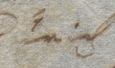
Escher
